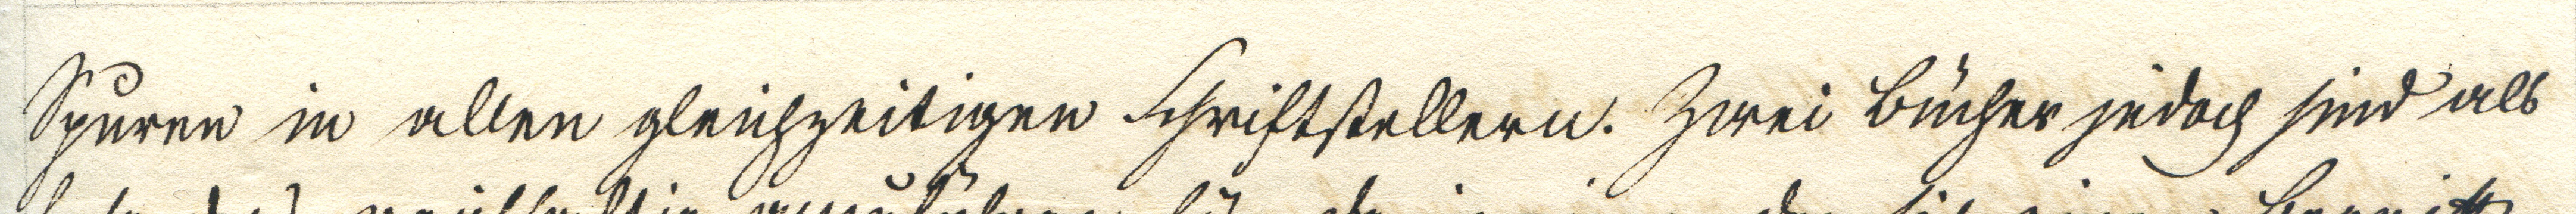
Spuren in allen gleichzeitigen Schriftstellern. Zwei Bücher jedoch sind als
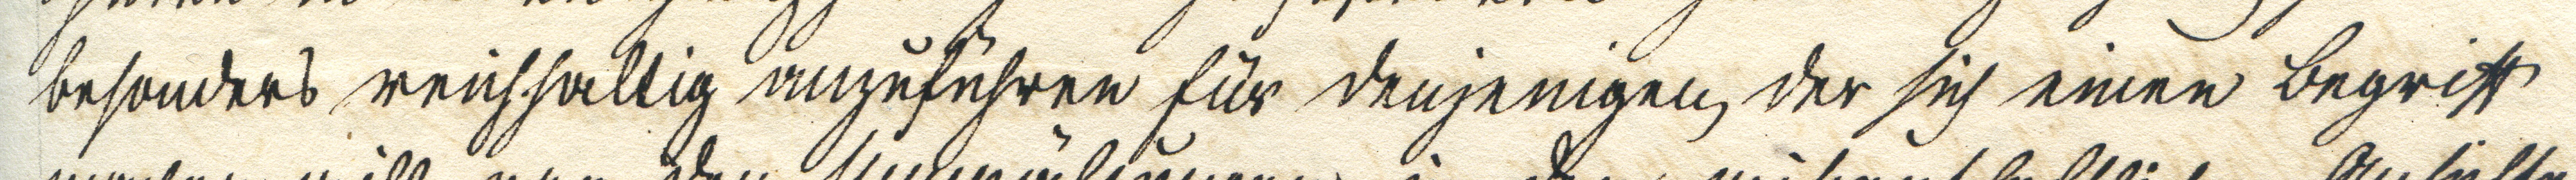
besonders reichhaltig anzuführen für denjenigen, der sich einen Begriff
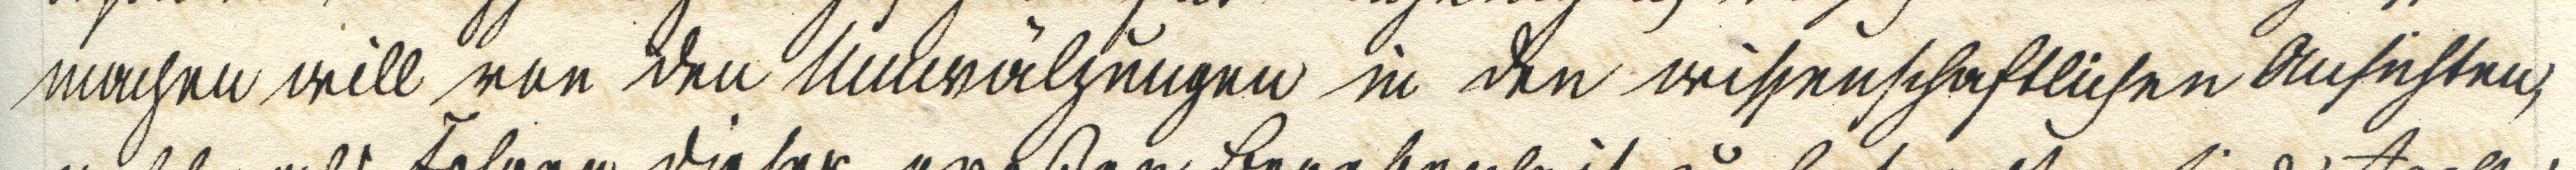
machen will von den Umwälzungen in den wissenschaftlichen Ansichten,
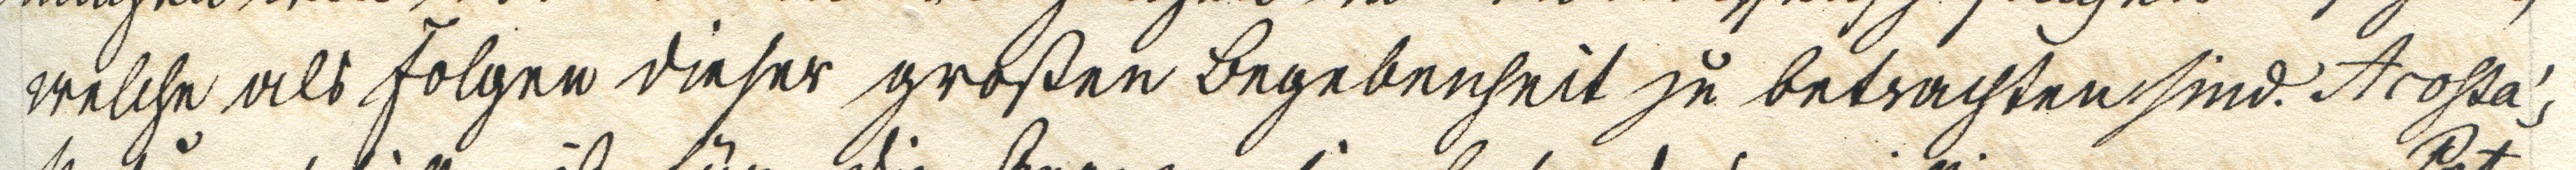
welche als Folge dieser großen Begebenheit zu betrachten sind. Acosta’s
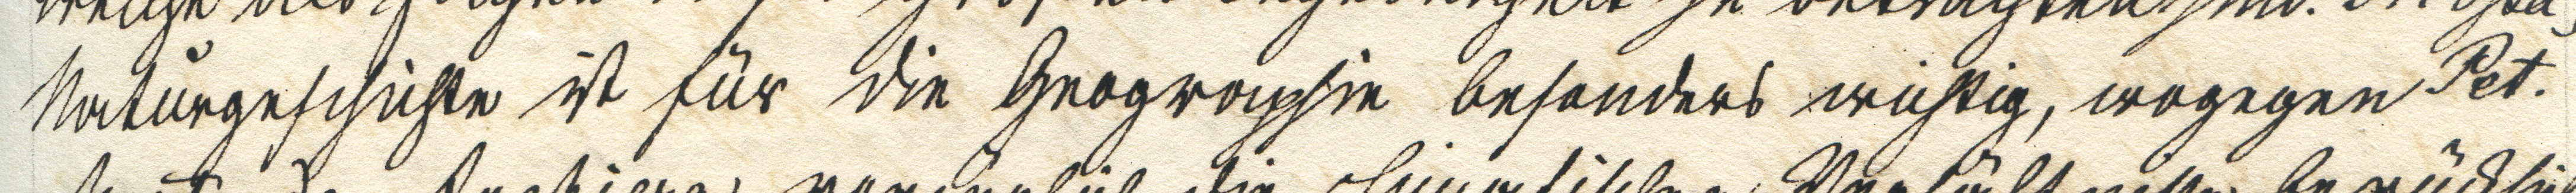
Naturgeschichte ist für die Geographie besonders wichtig, wogegen Pet.
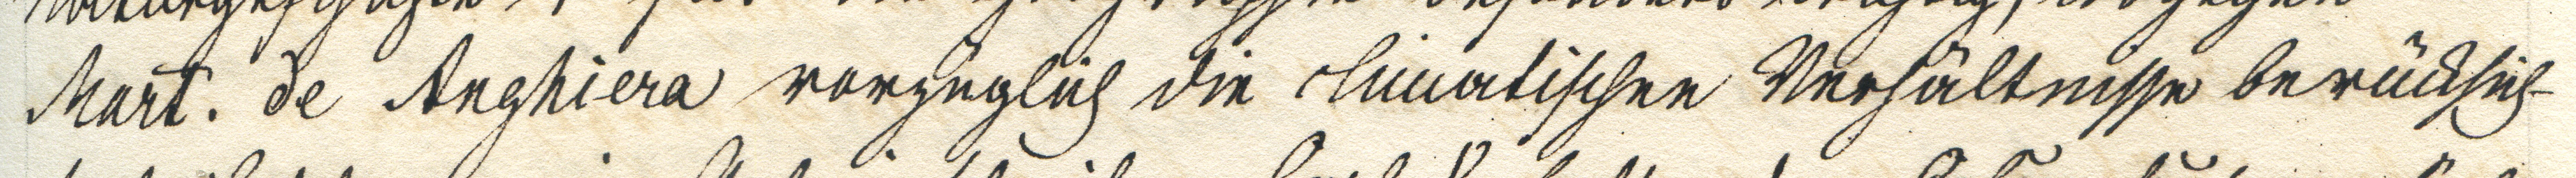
Mart. de Anghiera vorzüglich die climatischen Verhältnisse berücksich-
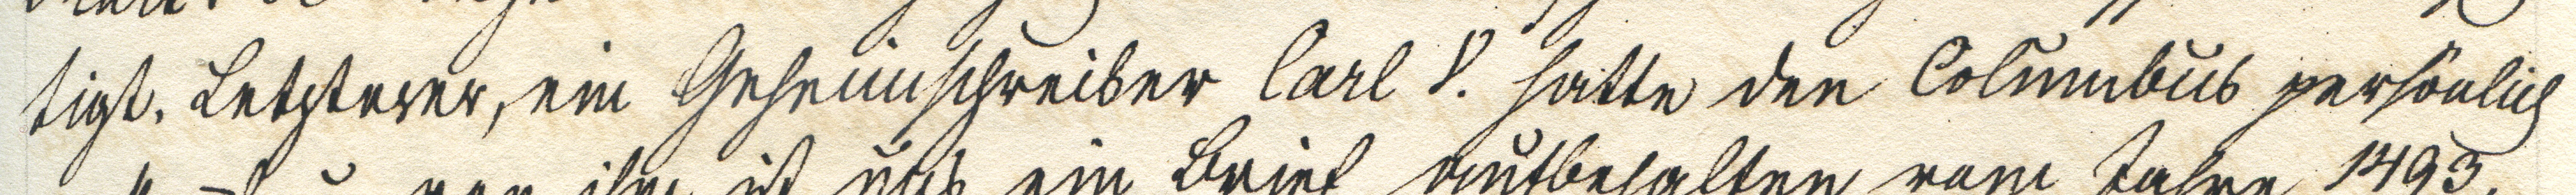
tigt. Letzterer, ein Geheimschreiber Carl V. hatte den Columbus persönlich
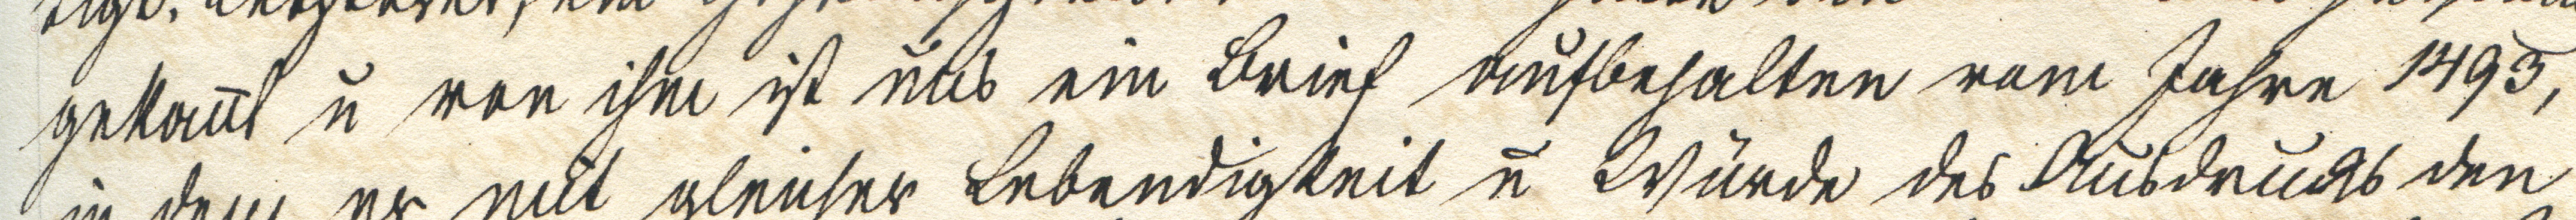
gekañt u von ihm ist uns ein Brief aufbehalten vom Jahre 1493,
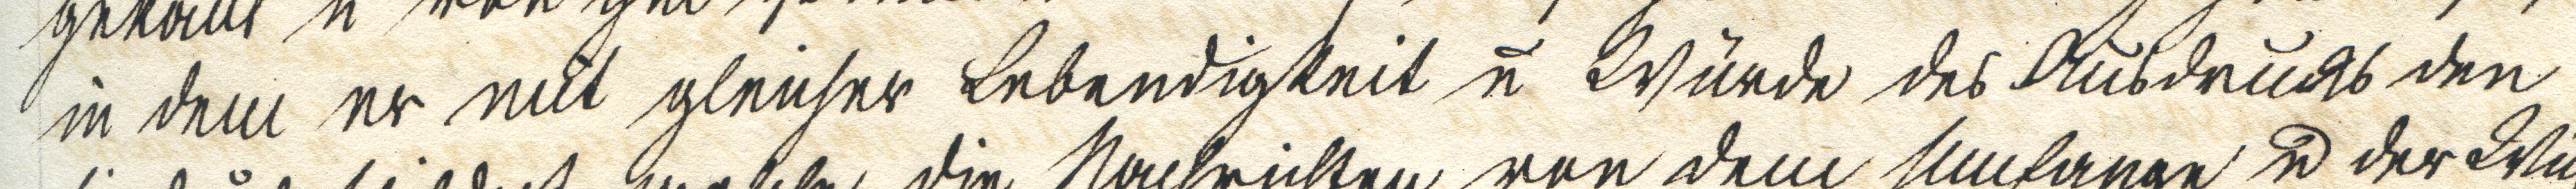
in dem er mit gleicher Lebendigkeit u Würde des Ausdrucks den
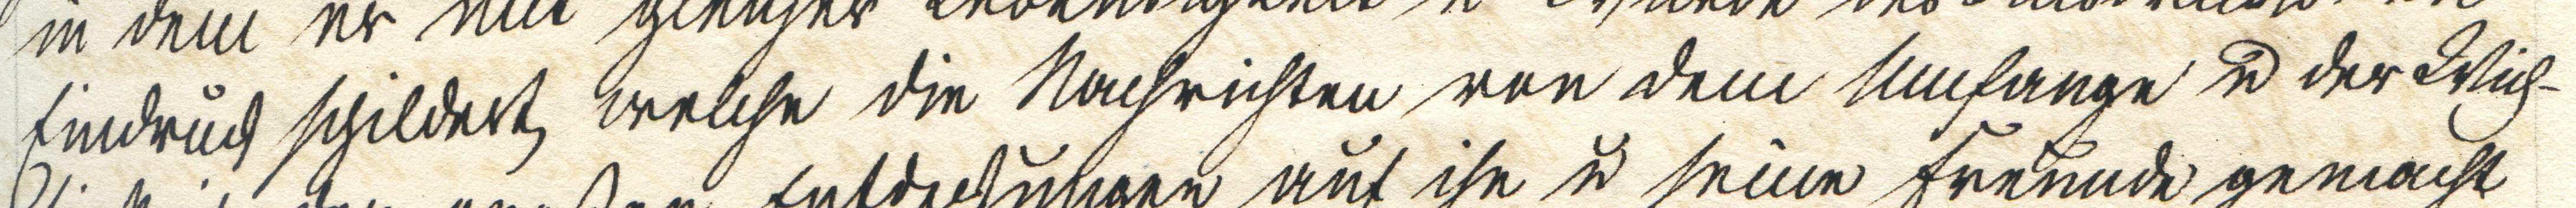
Eindruck schildert, die Nachrichten von dem Umfange u der Wich-
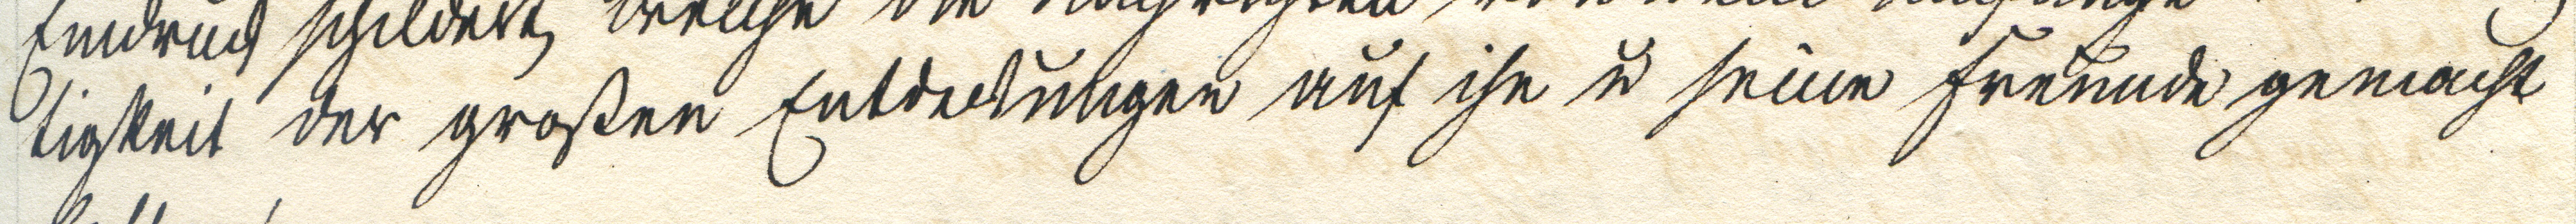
tigkeit der großen Entdeckungen auf ihn u seine Freunde gemacht
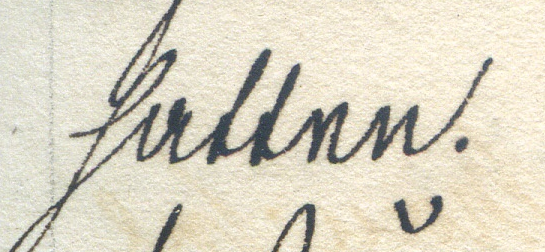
hatten.
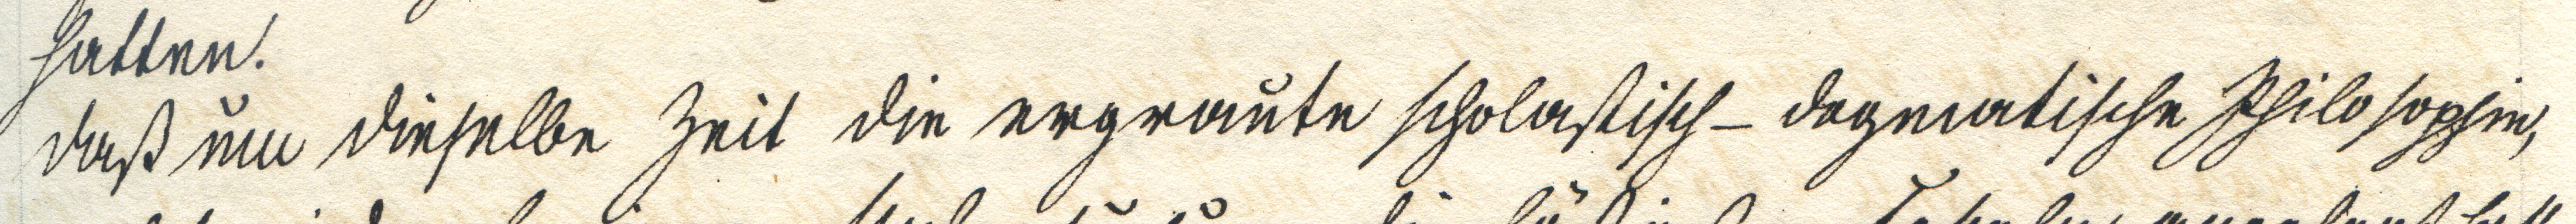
Daß um dieselbe Zeit die ergraute scholastisch-dogmatische Philosophie,
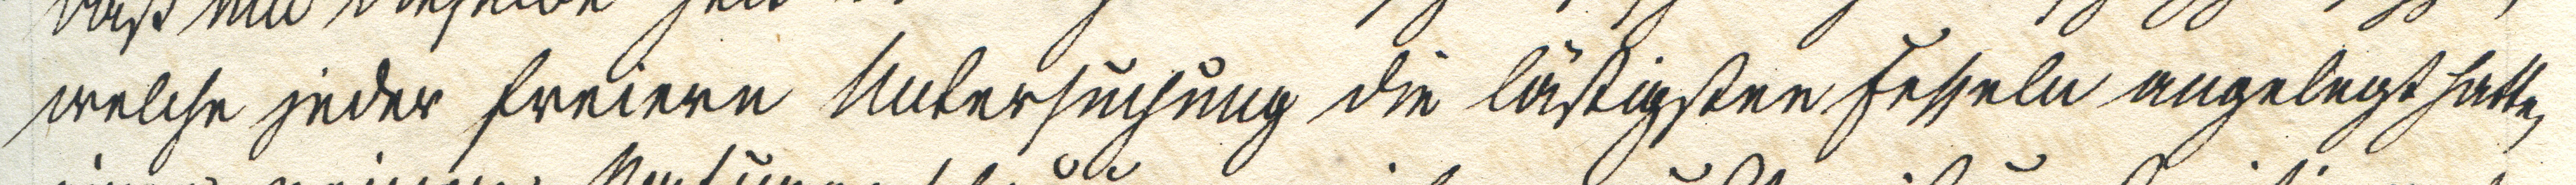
welche jeder freieren Untersuchung die lästigsten Fesseln angelegt hatte,
